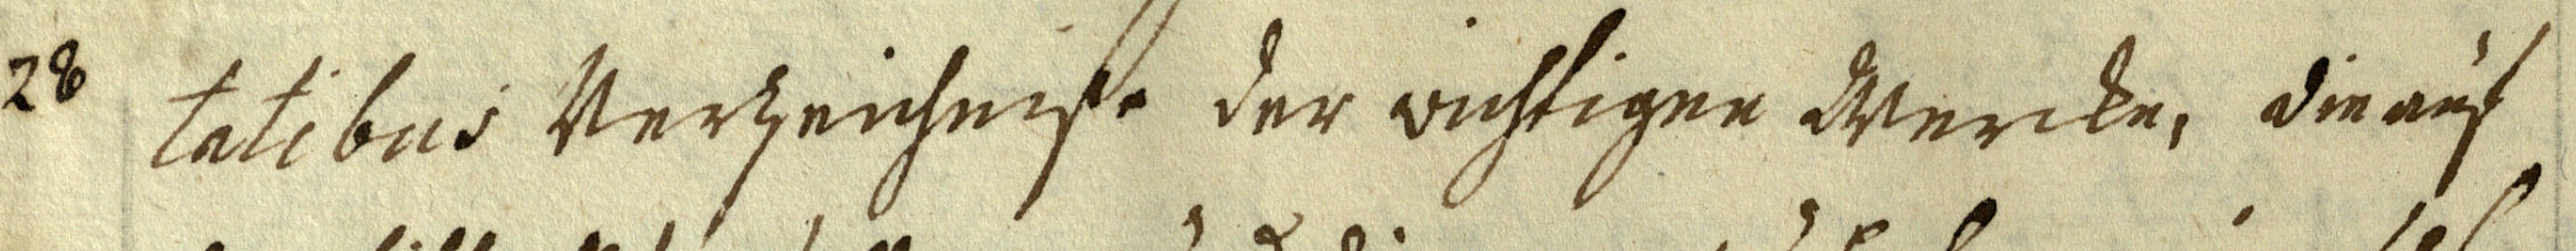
tatibus Verzeichniße der wichtigen Wercke, die auf
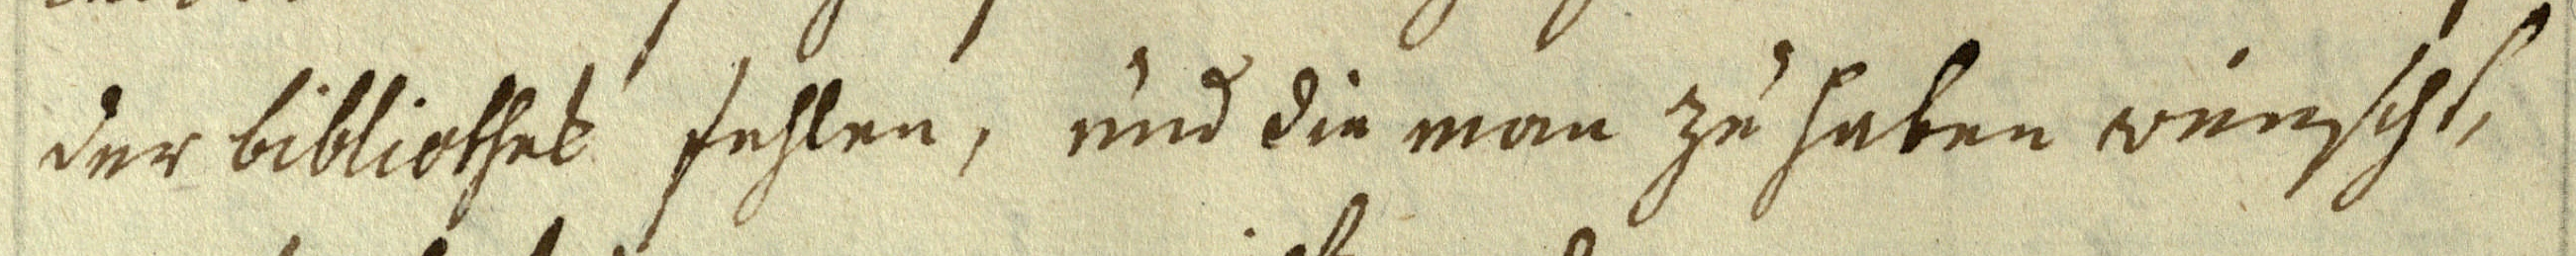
der bibliothek fehlen, und die man zu haben wünscht,
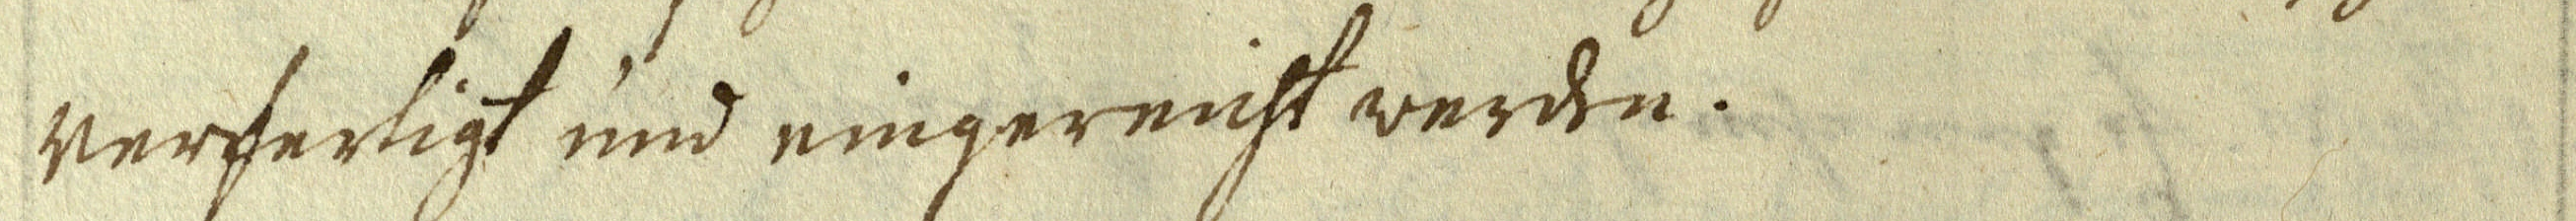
verfertiget und eingereicht werden.
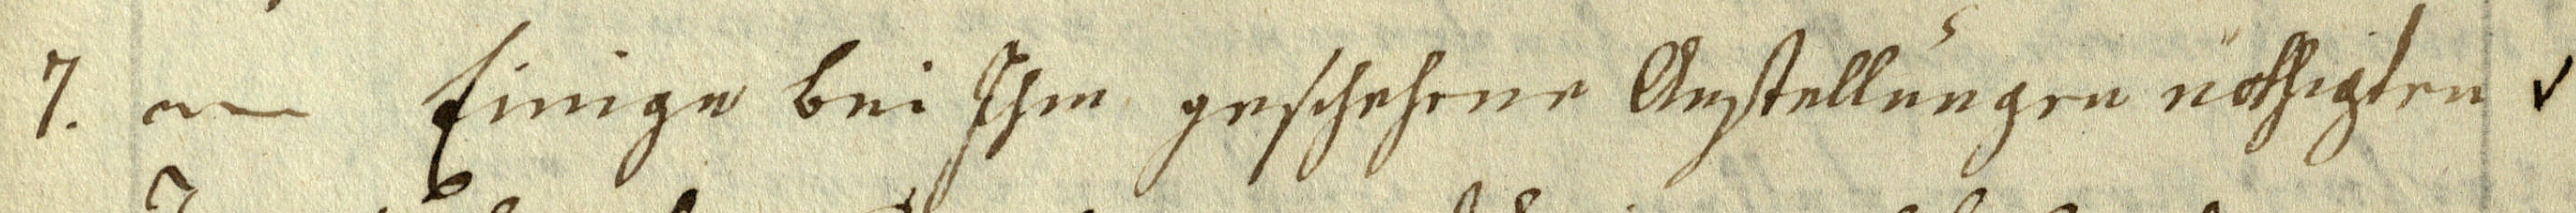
7. Einige bei Ihm geschehene Anstellungen nöthigten
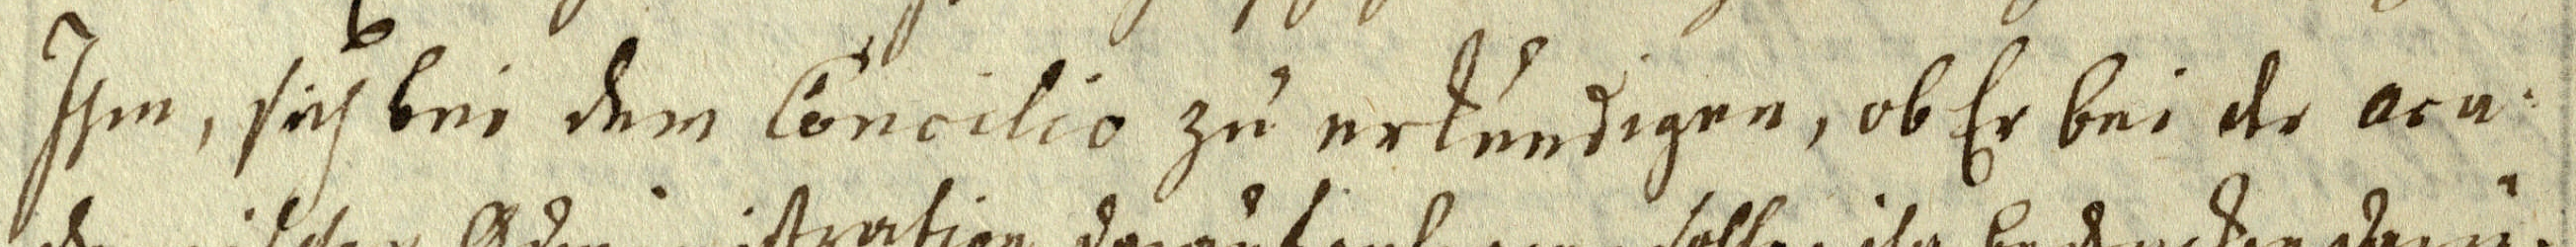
Ihm, sich bei dem Concilio zu erkundigen, ob Er bei der Aca¬
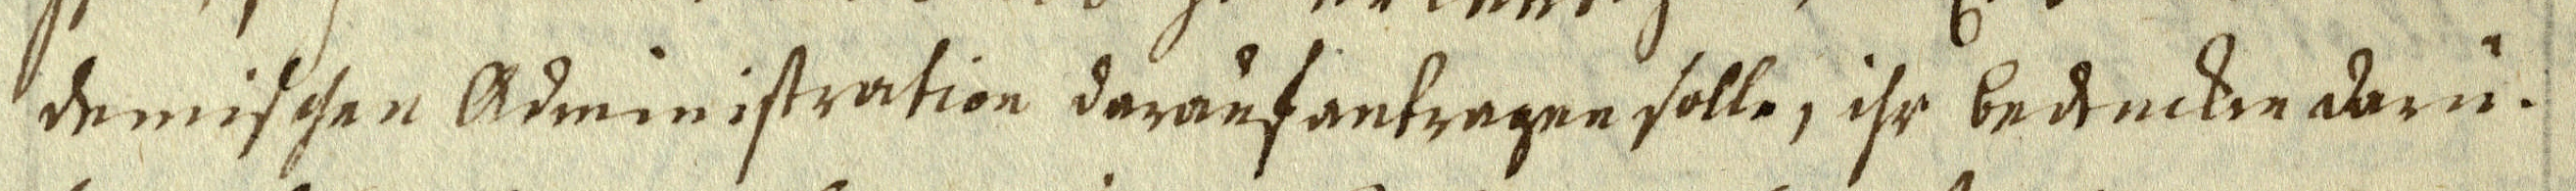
demischen Administration darauf antragen solte, ihr Bedencken darü¬
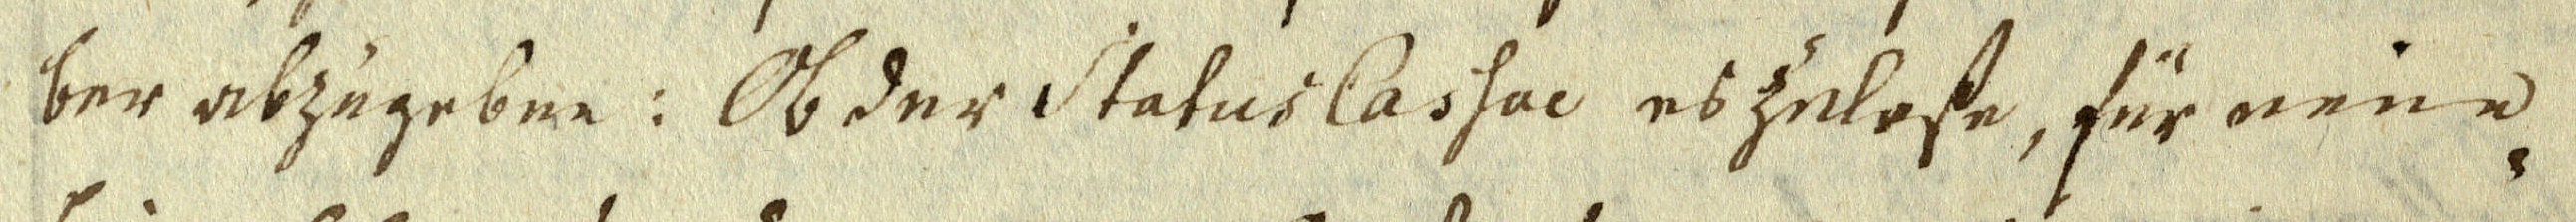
ber abzugeben: Ob der Status Cassae es zulaße, für neue
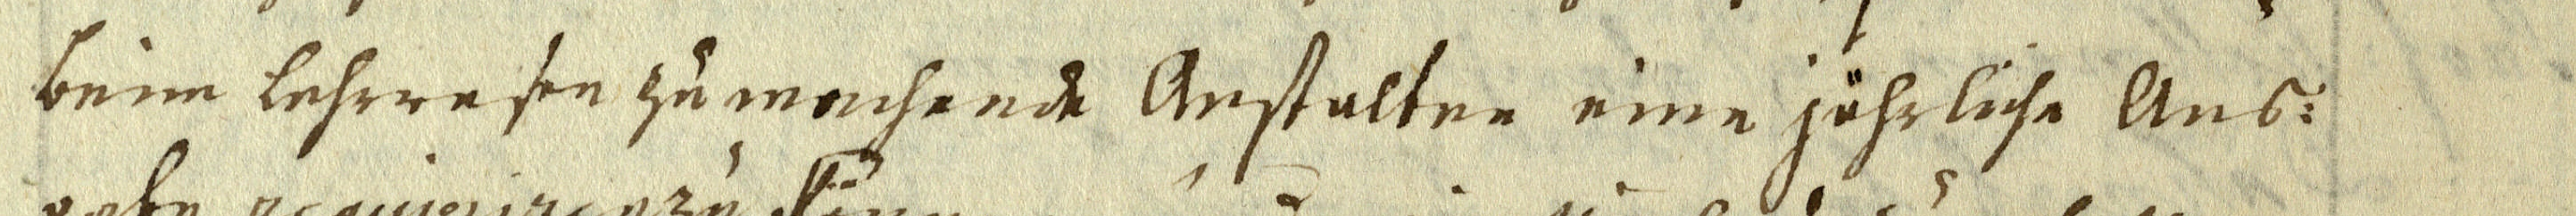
beim Lehrwesen zu machende Anstalten eine jährliche Aus¬
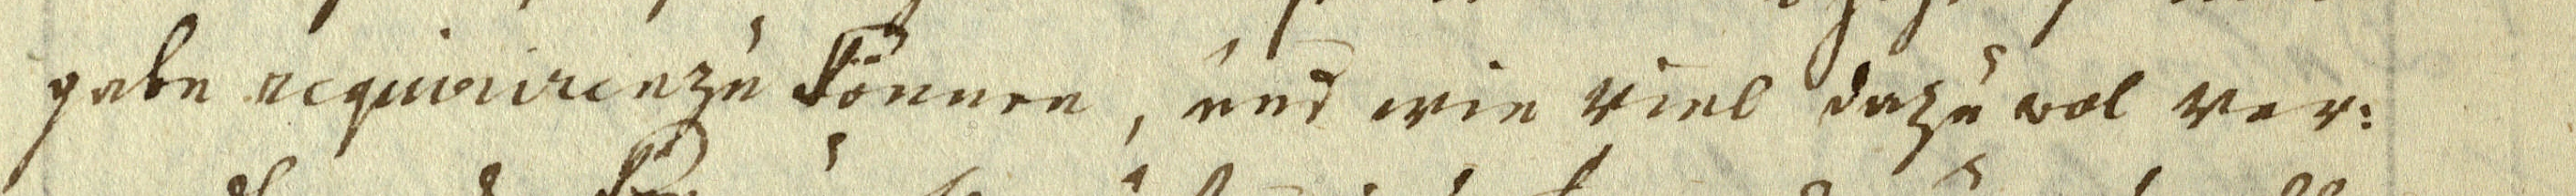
gabe requiriren zu können, und wie viel dazu wol ver¬
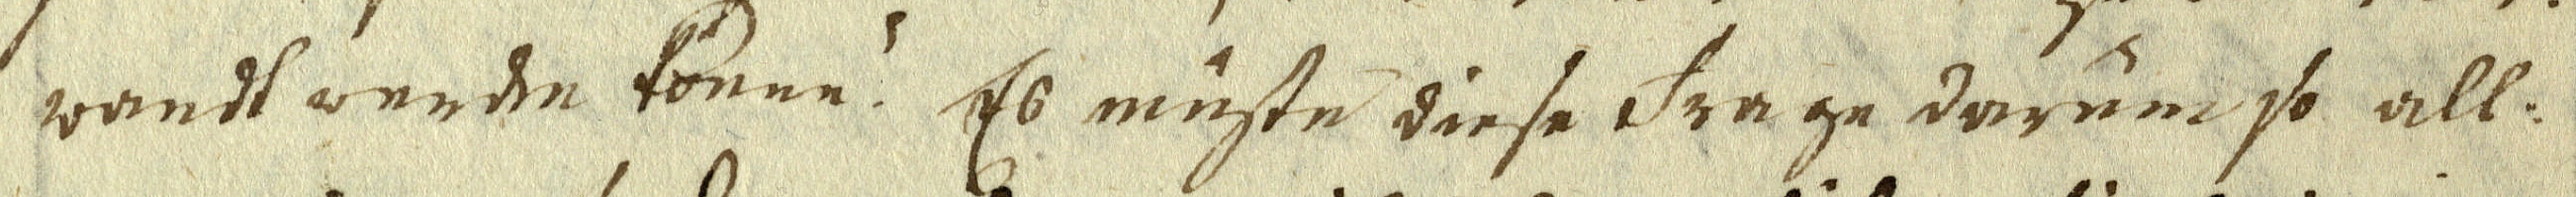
wandt werden könne? Es müste diese Frage darum so all¬
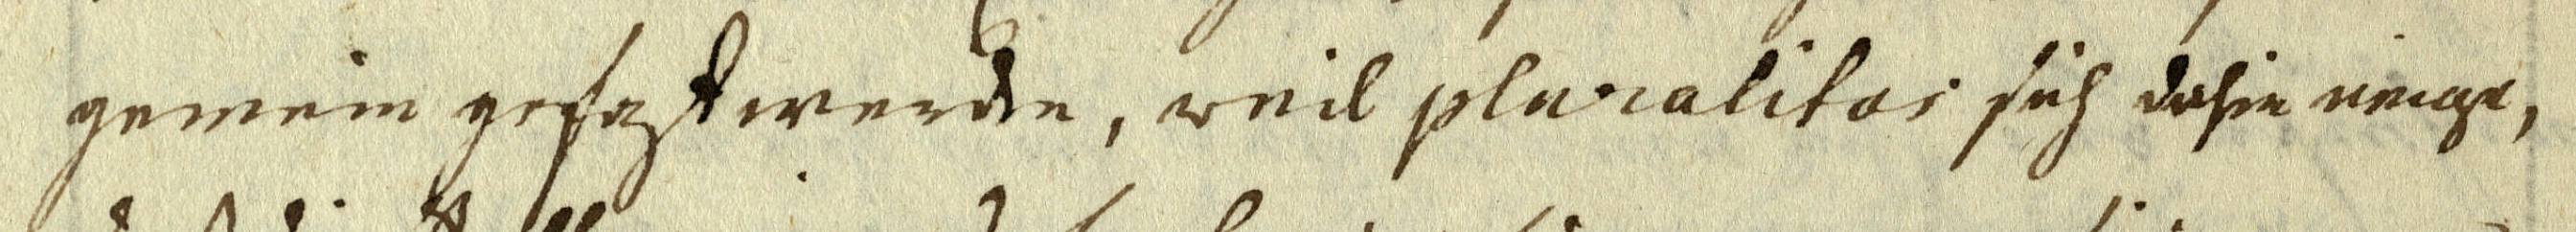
gemein gefast werden, weil pluralitas sich dahin neige,
